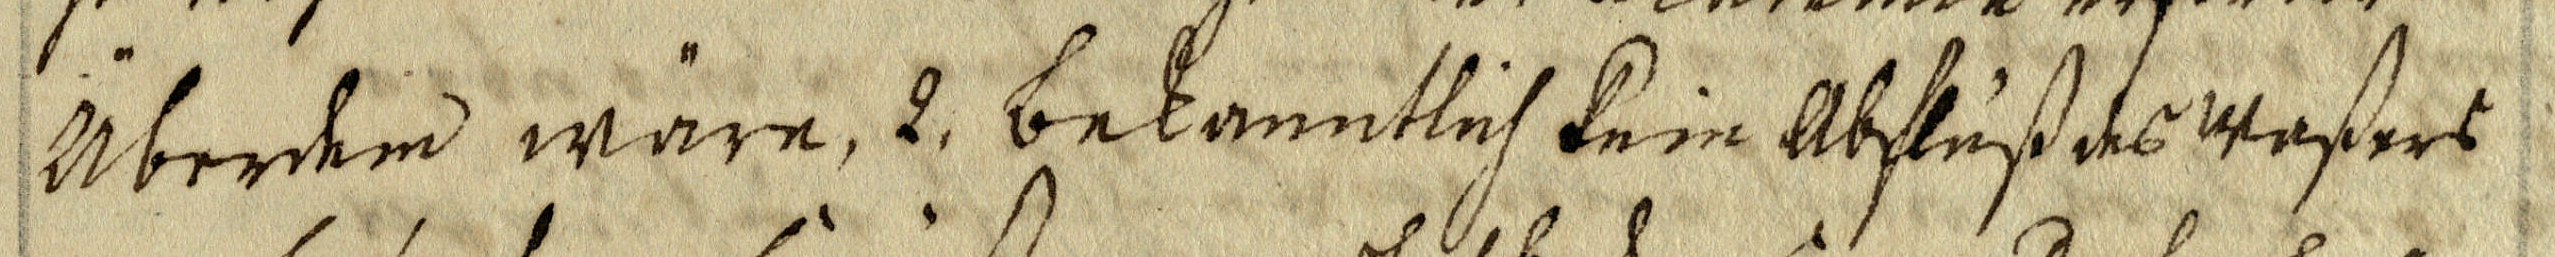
Überdem wäre, 2, bekanntlich kein Abfluß des Waßers
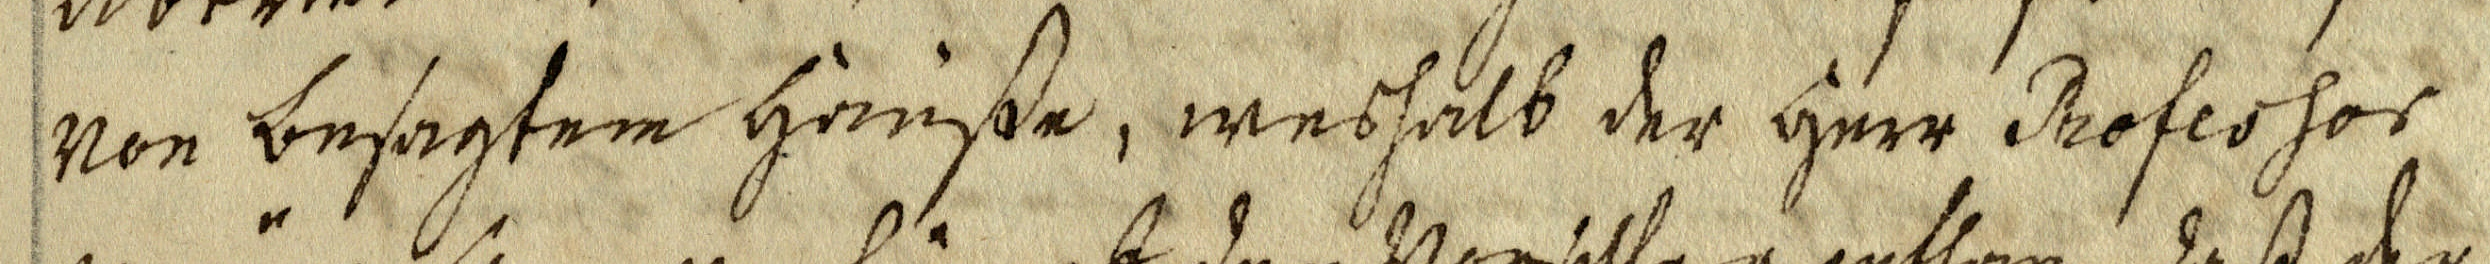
von besagtem Hauße, weshalb der Herr Professor
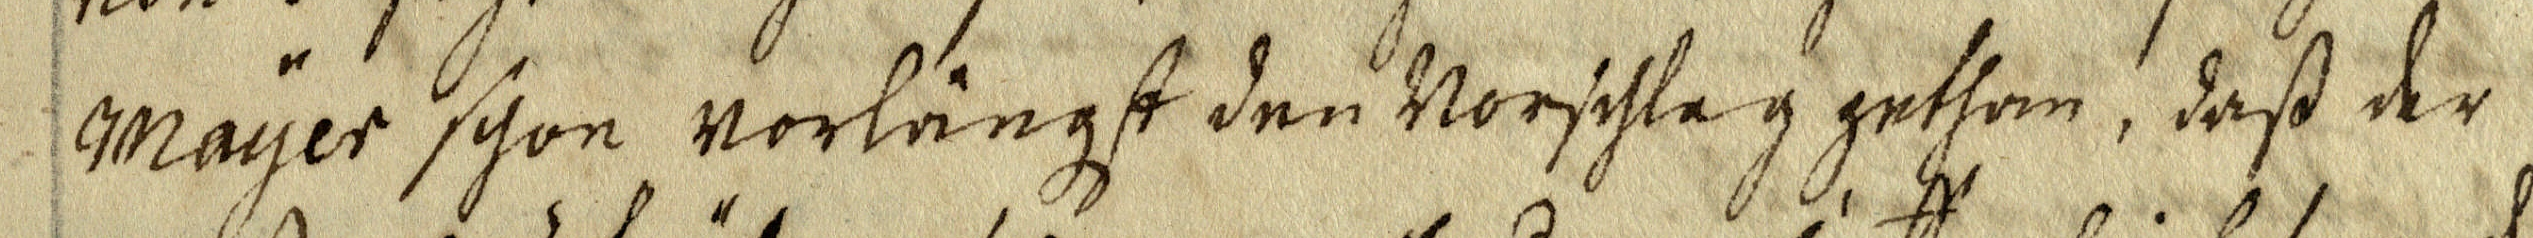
Maÿer schon vorlängst den Vorschlag gethan, daß der
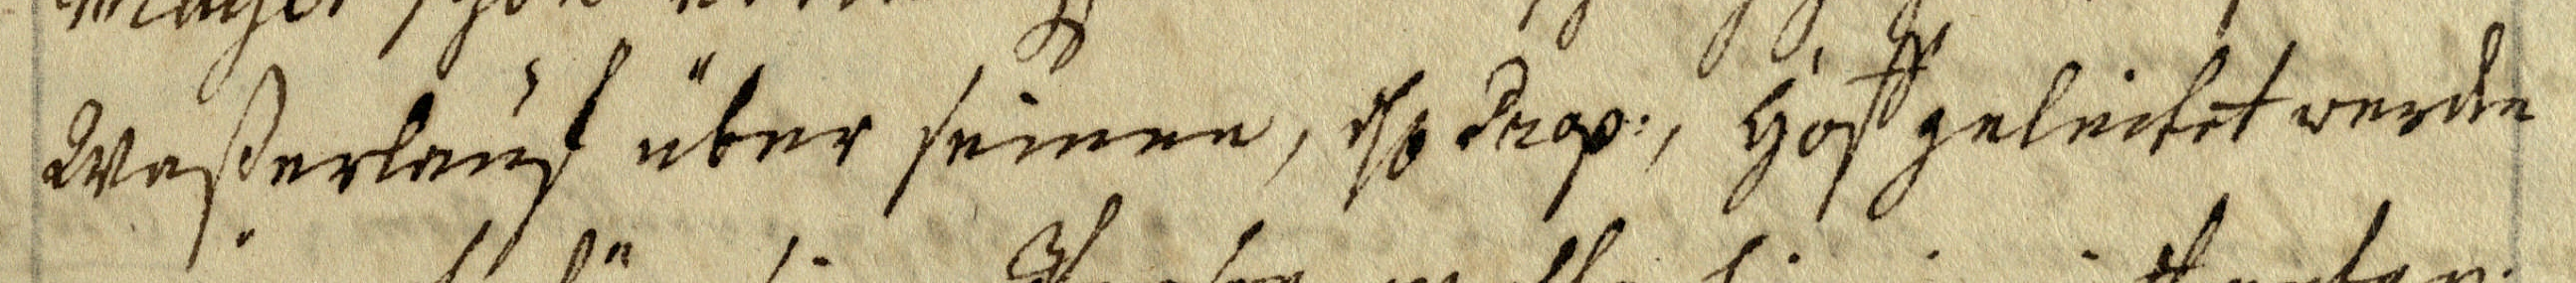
Waßerlauf über seinen , dh Prop: Hof geleitet werden
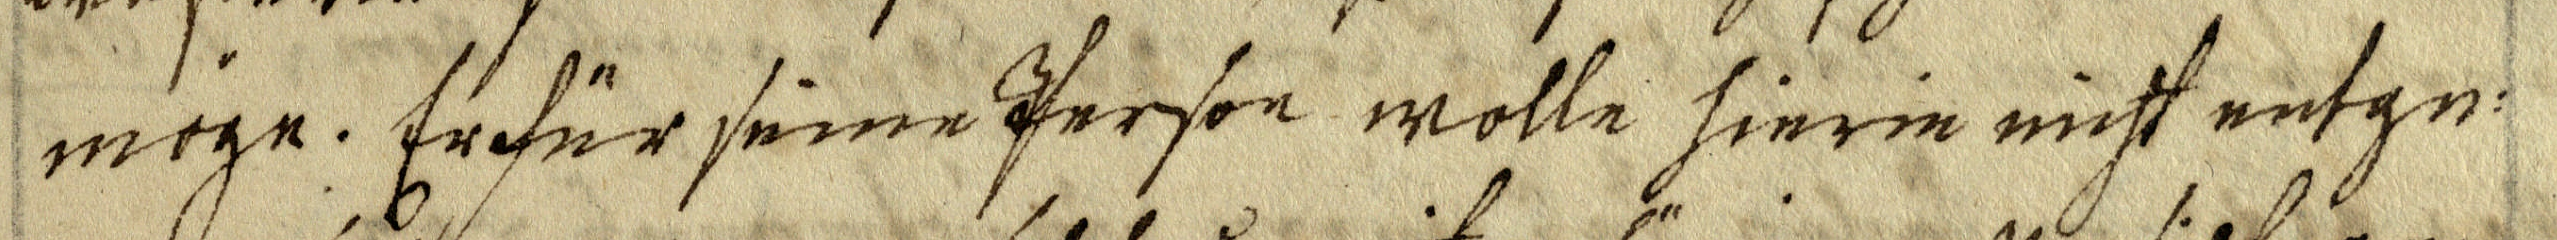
möge. Er für seine Person wolle hierin nicht entge¬
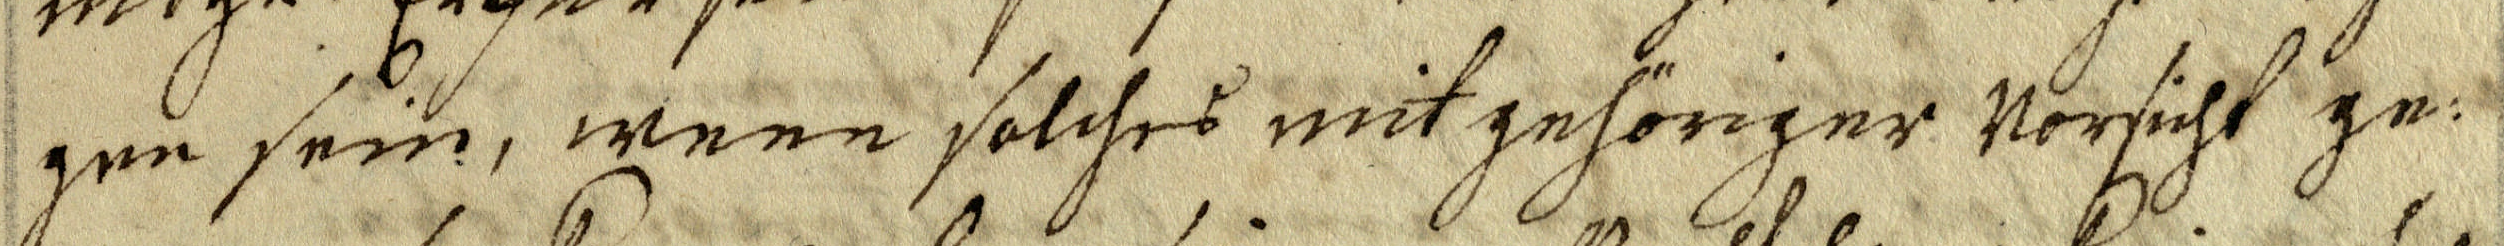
gen sein, wenn solches mit gehöriger Vorsicht ge¬
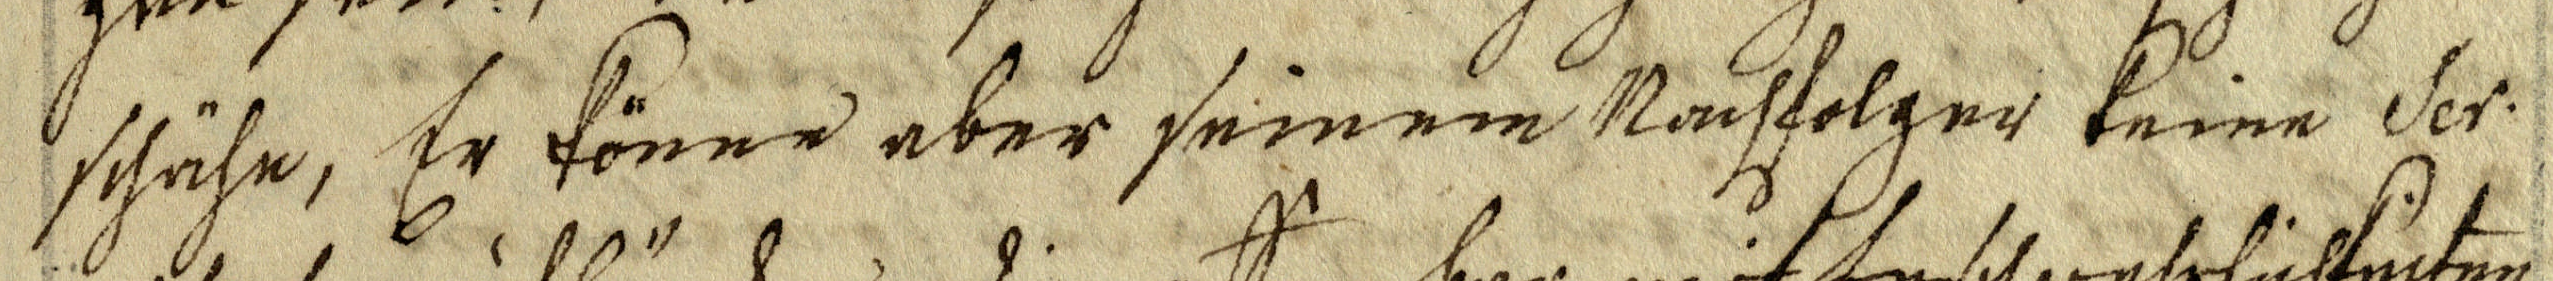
schähe, Er könne aber seinem Nachfolger keine Ser¬
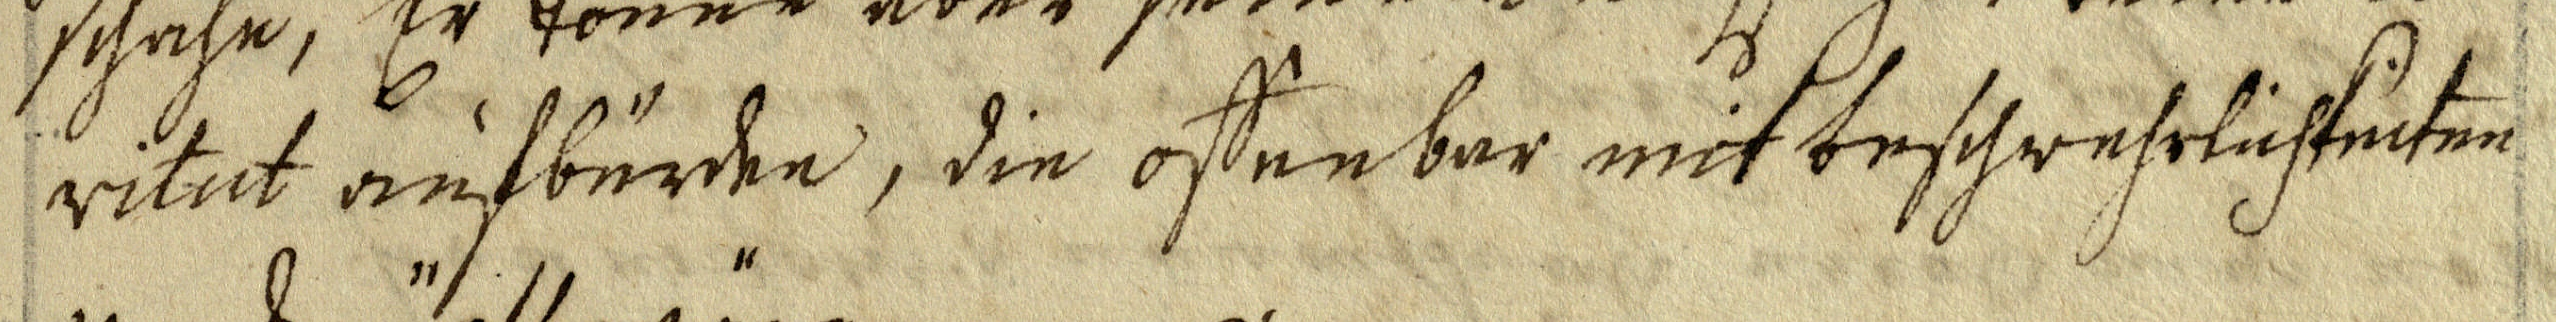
vitut aufbürden, die offenbar mit Beschwehrlichkeiten
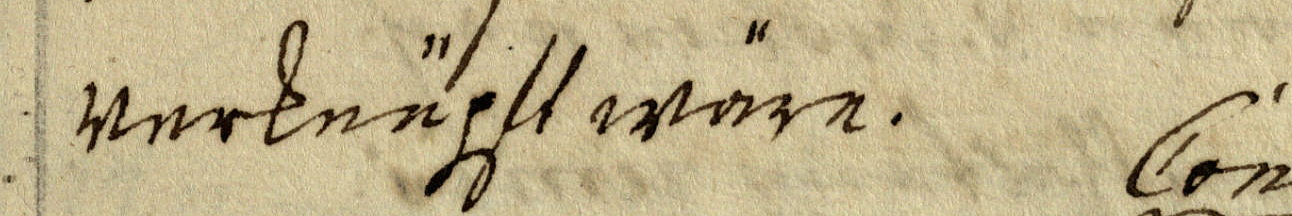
verknüpft wäre.
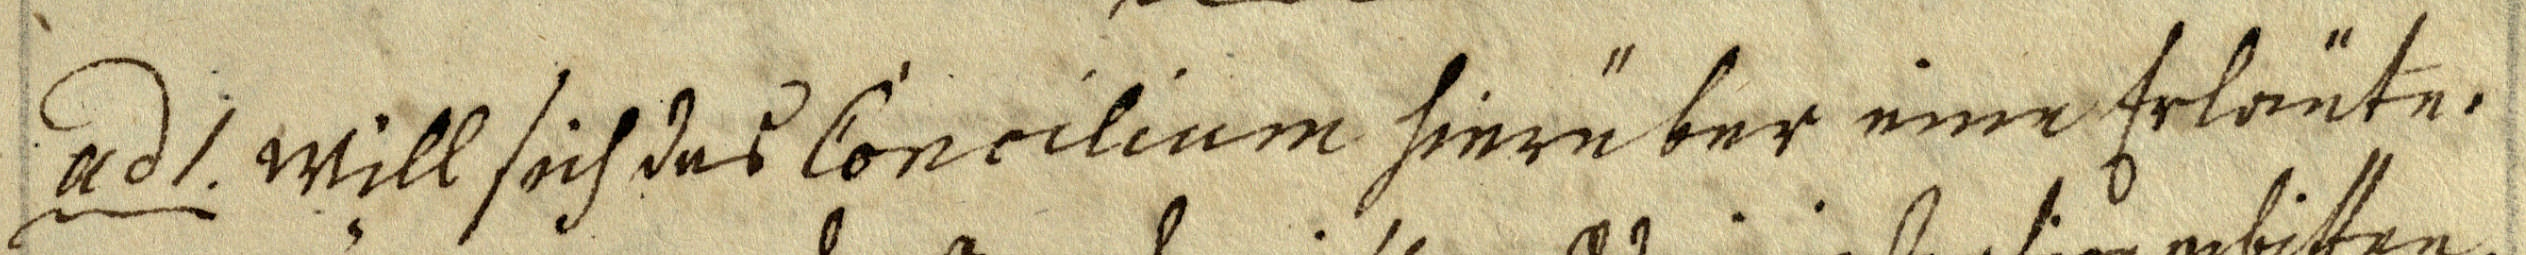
ad 1. will sich das Concilium hierüber eine Erläute¬
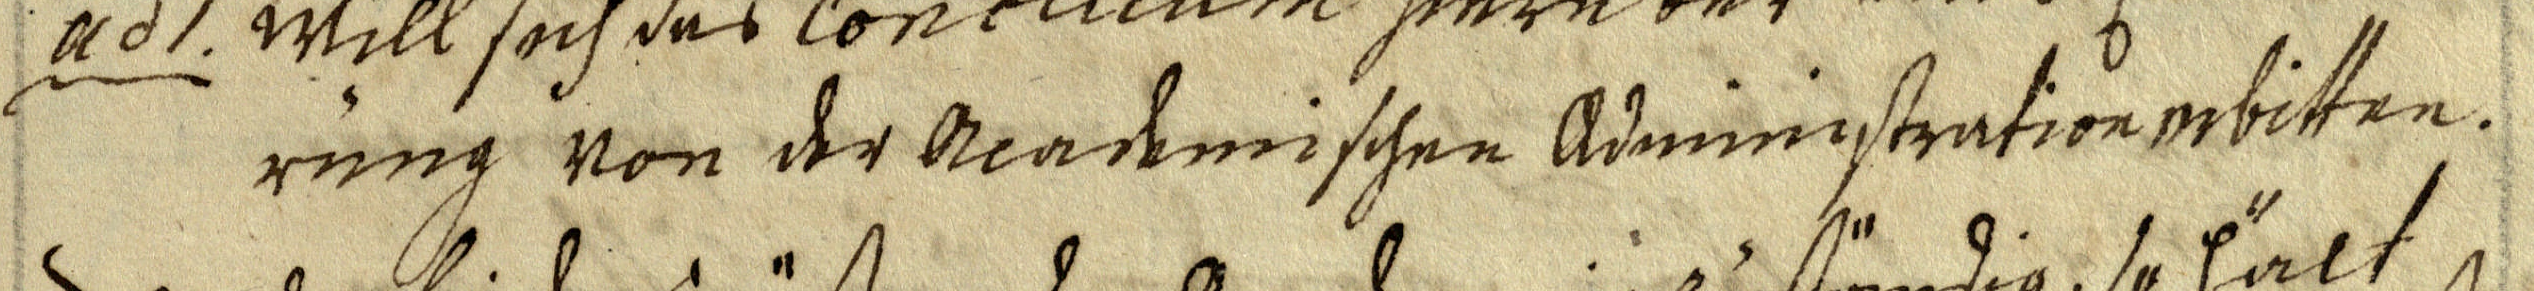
rung von der Academischen Administration erbitten.
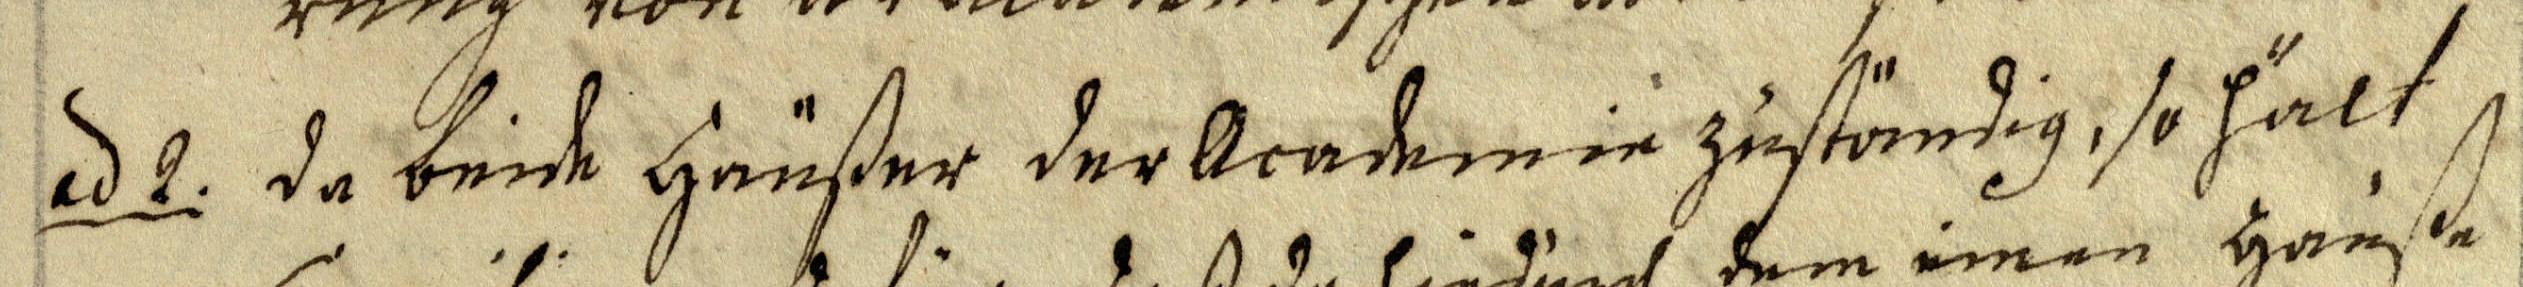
ad 2. da beide Häußer der Academie zuständig, so hält
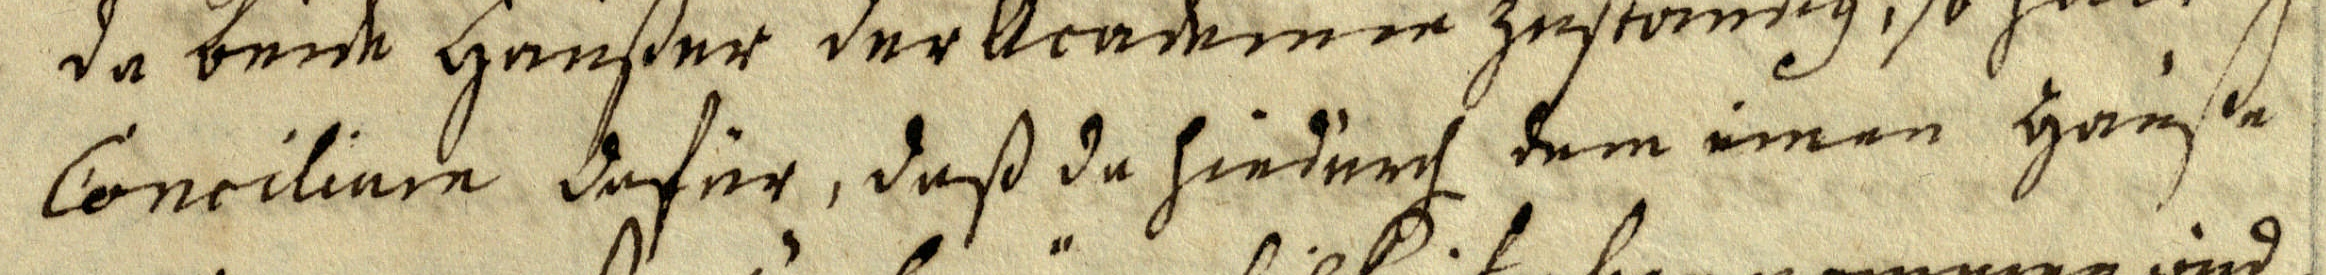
Concilium dafür, daß da hiedurch dem einen Hauße
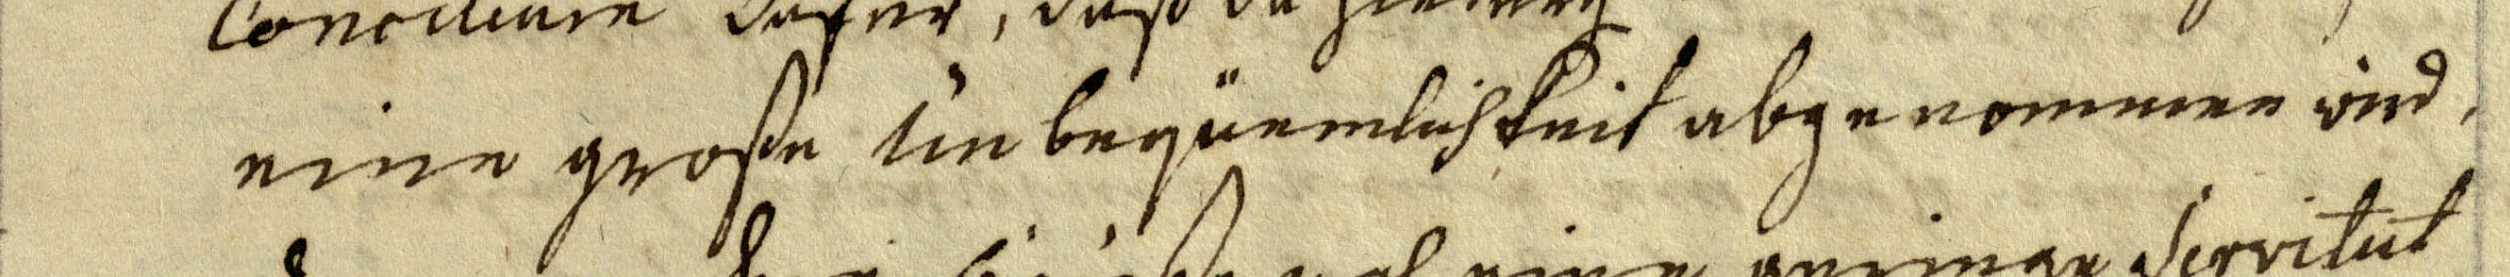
eine große Unbequemlichkeit abgenommen wird,
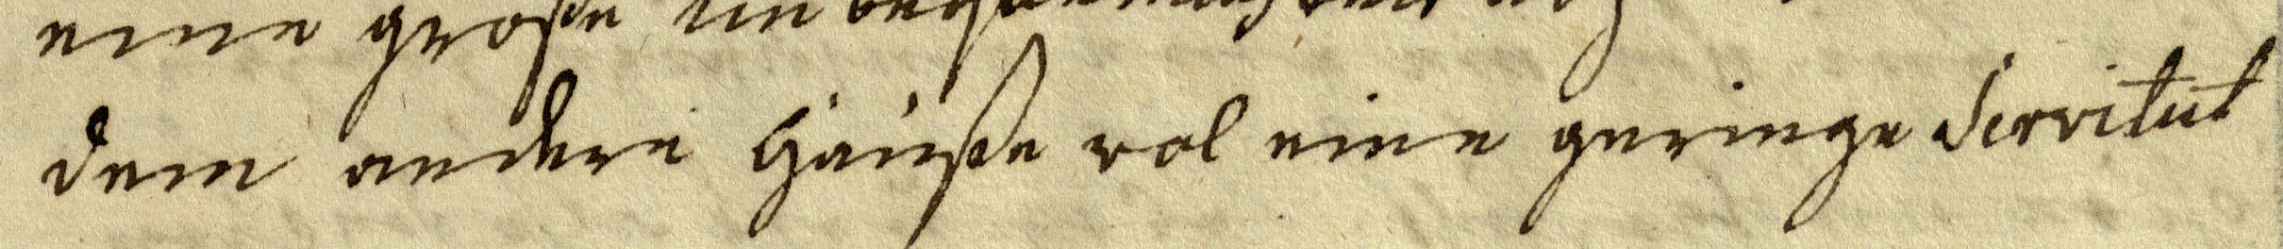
dem andern Hauße wol eine geringe Servitut
